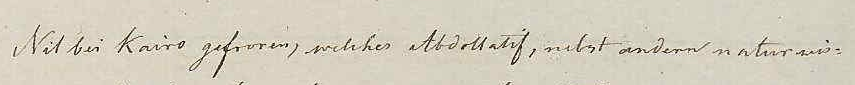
Nil bei Kairo gefroren, welches Abdellatif, nebst andern naturwis-
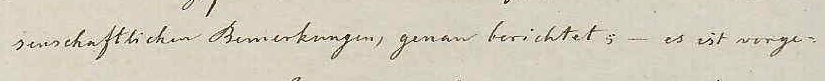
senschaftlichen Bemerkungen, genau berichtet; – es ist vorge-
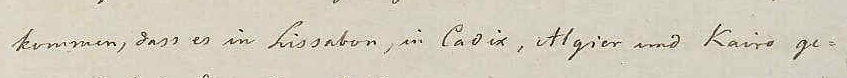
kommen, dass es in Lissabon, in Cadix, Algier und Kairo ge-
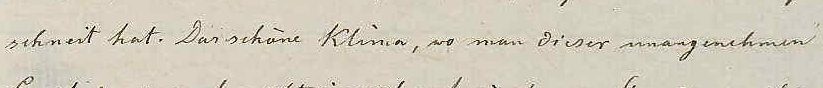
schneit hat. Das schöne Klima, wo man dieser unangenehmen
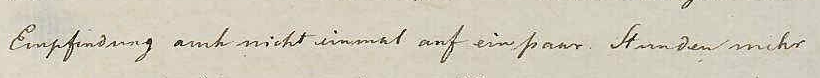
Empfindung auch nicht einmal auf ein paar Stunden mehr
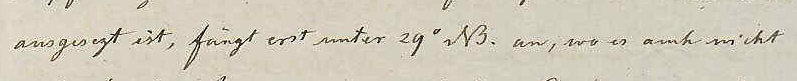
ausgesezt ist, fängt erst unter 29° NB. an, wo es auch nicht
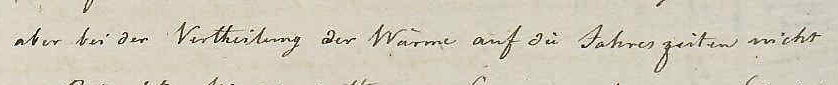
aber bei der Vertheilung der Wärme auf die Jahreszeiten nicht
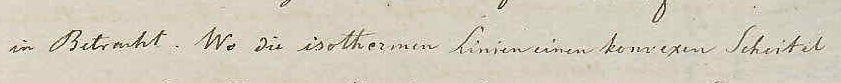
in Betracht. Wo die isothermen Linien einen konvexen Scheitel
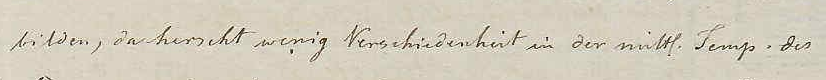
bilden, da herscht wenig Verschiedenheit in der mittl. Temp. des
